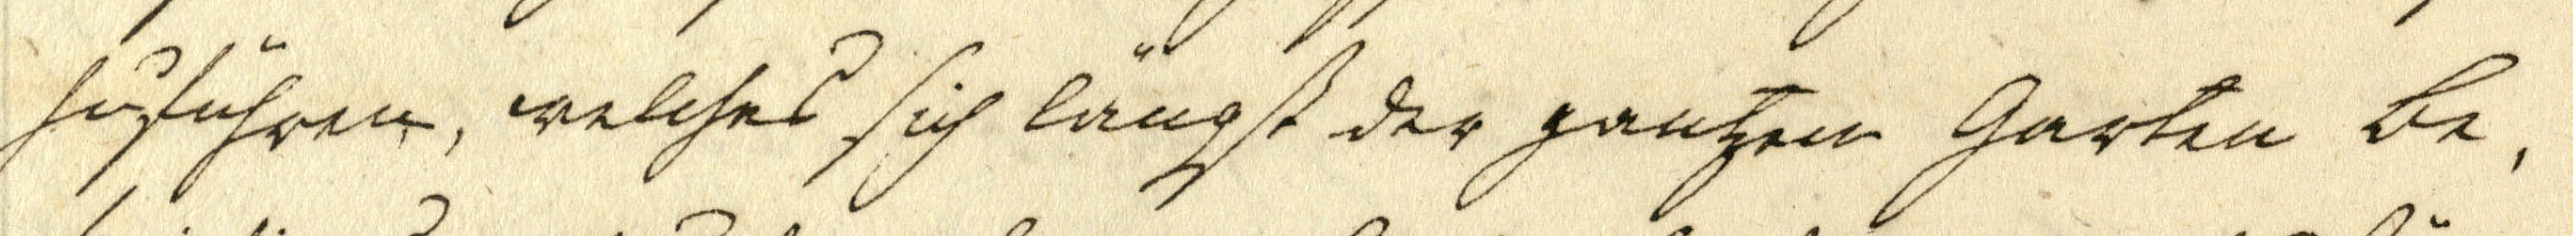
zuführen, welches sich längs der gantzen Garten Be¬
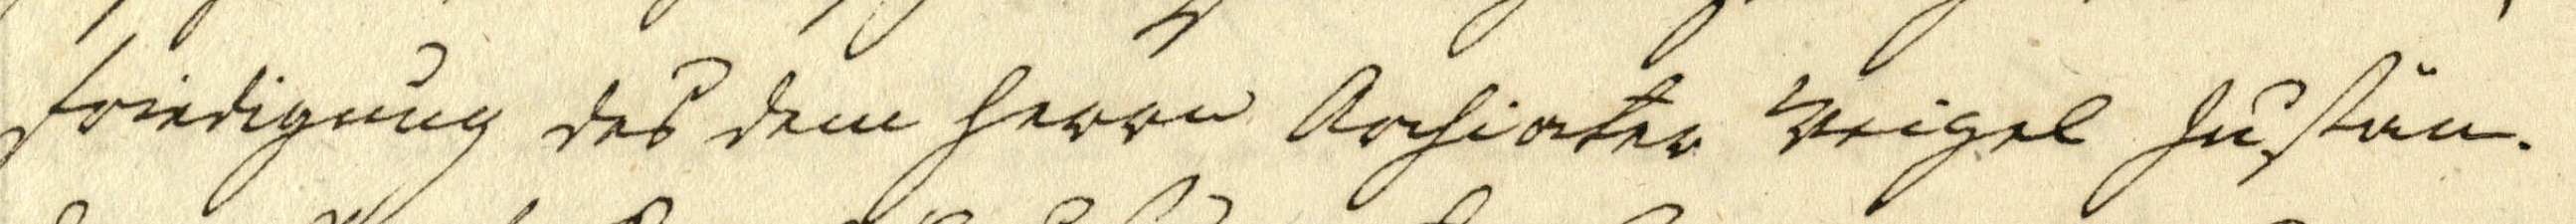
friedigung des dem herrn Archiater Weigel zustän¬
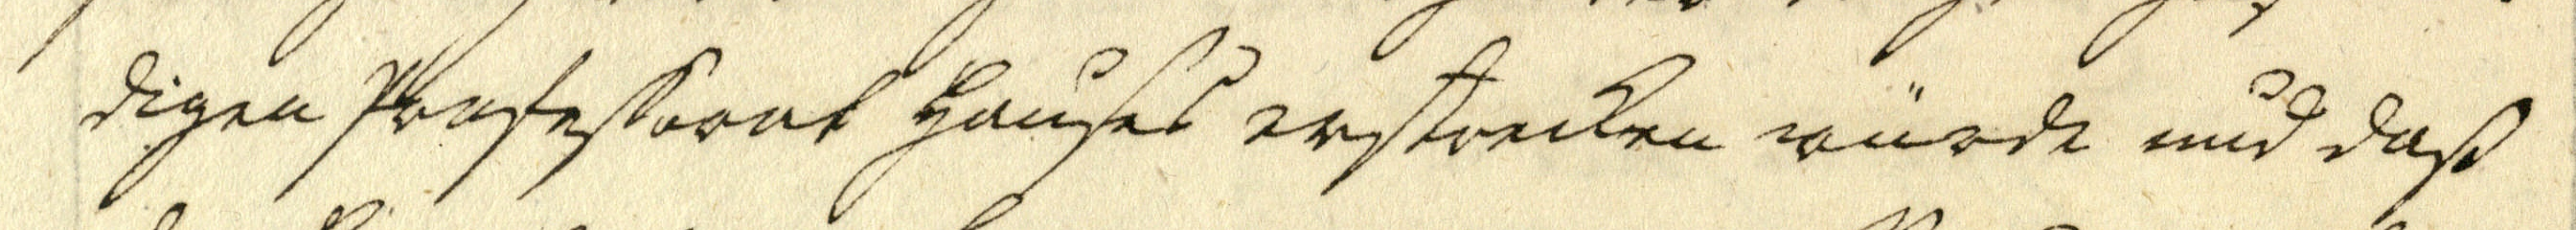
digen Professorat Hauses erstrecken würde und daß
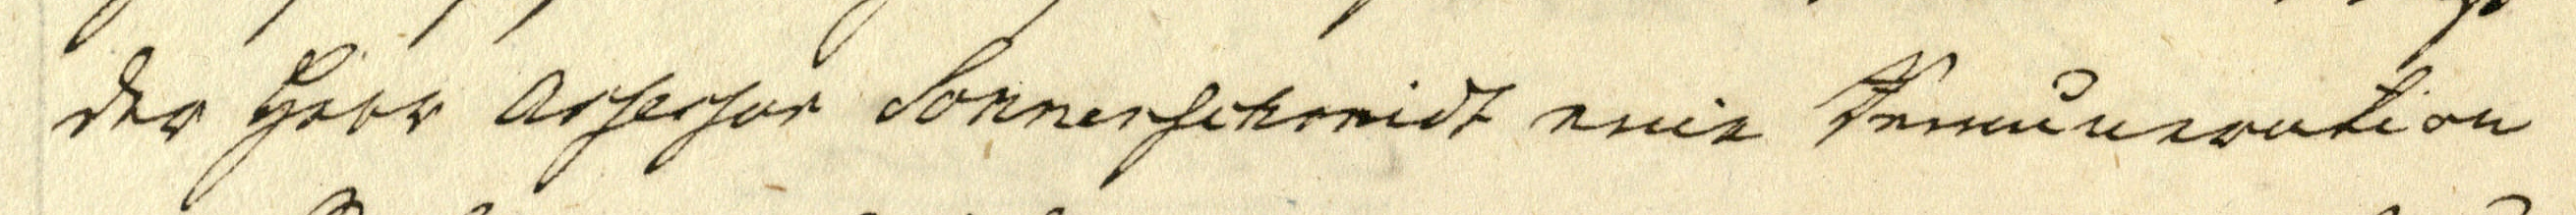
der Herr Assessor Sonnenschmidt eine Remuneration
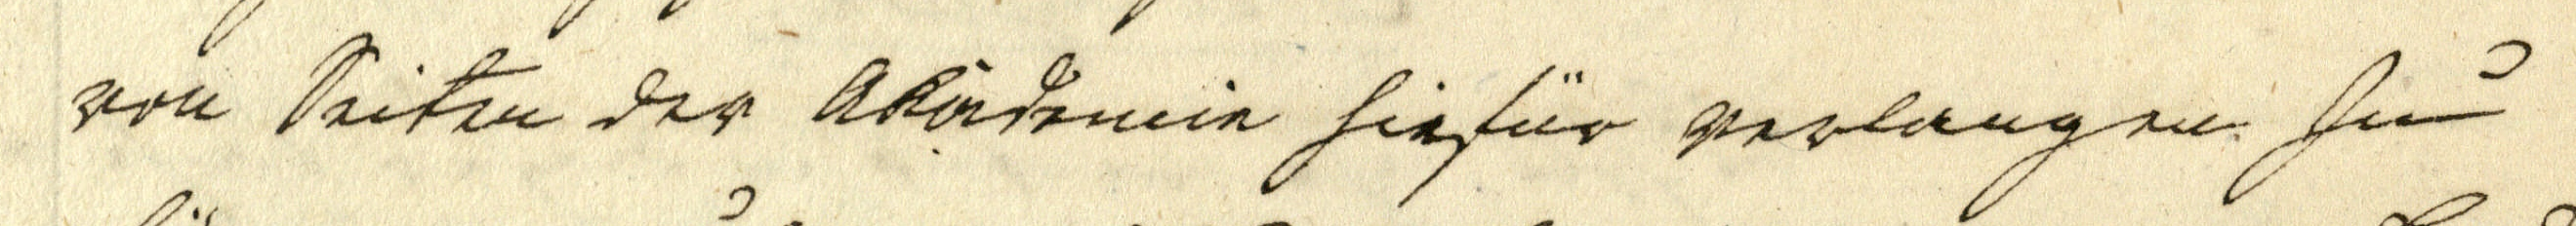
von Seiten der Akademie hiefür verlangen zu
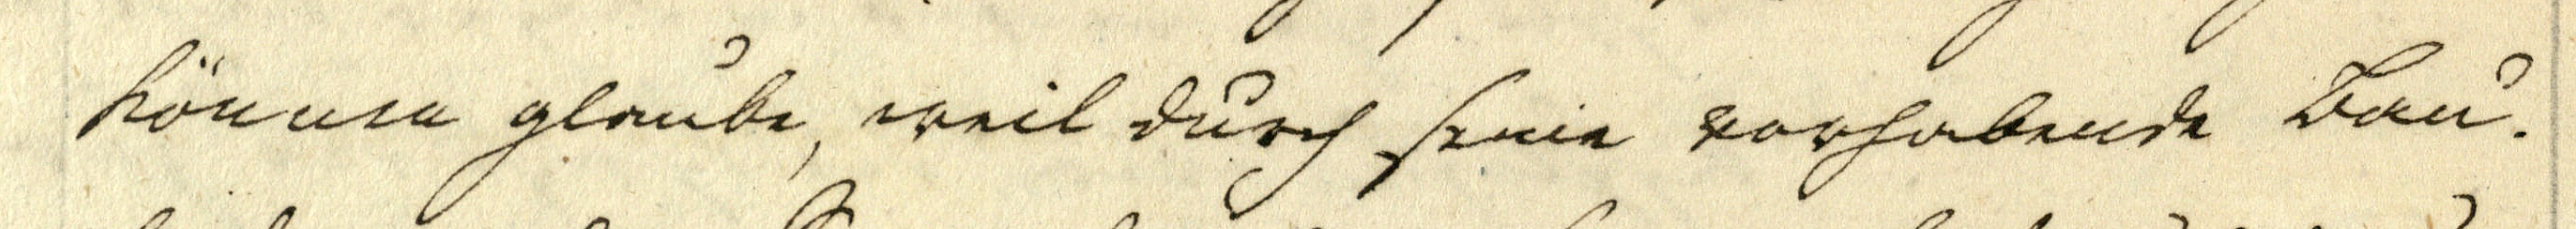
können glaube, weil durch seine vorhabende Bau¬
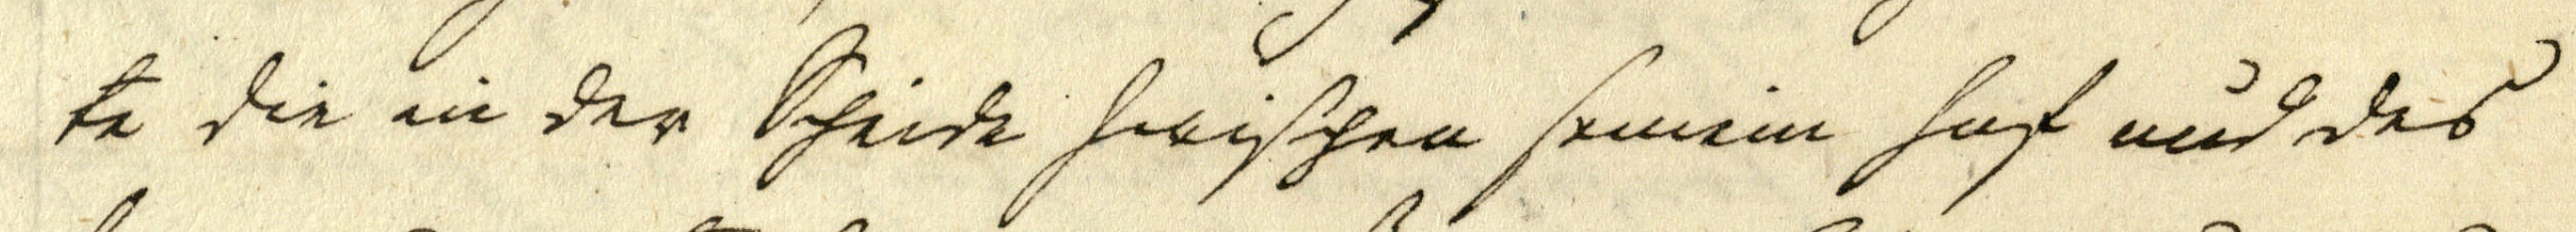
te die in der Scheide zwischen seinem Hof und des
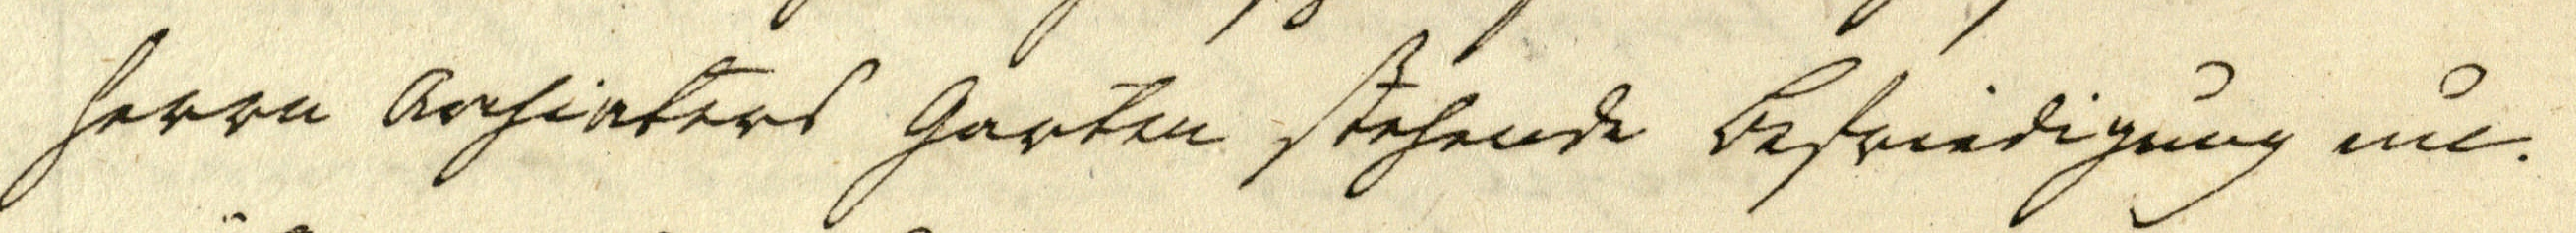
herrn Archiaters Garten stehende Befriedigung un¬
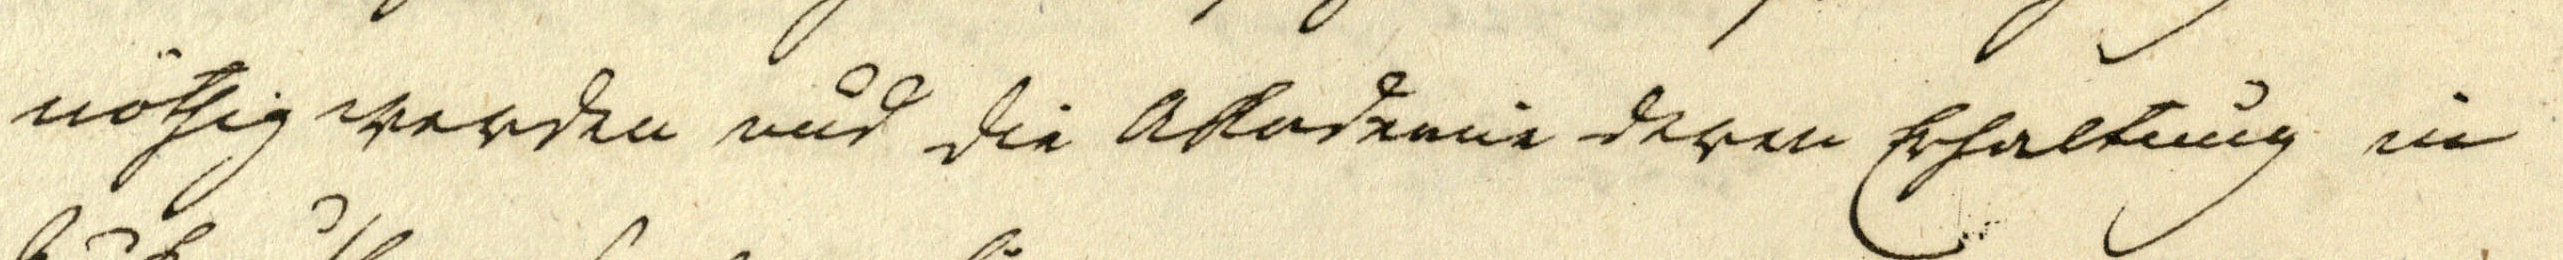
nöthig werden und die Akademie deren Erhaltung in
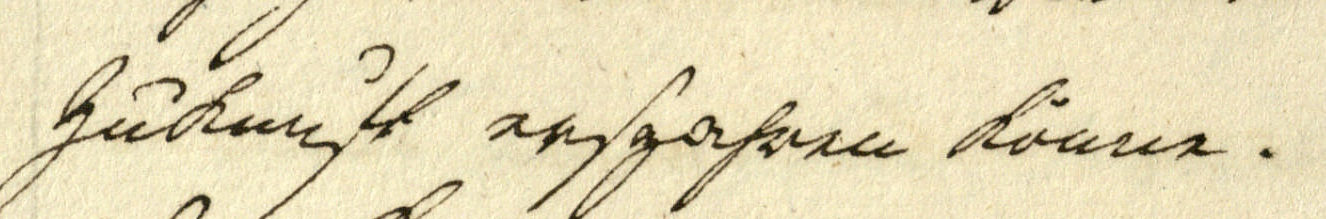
Zukunft erspahren könne.
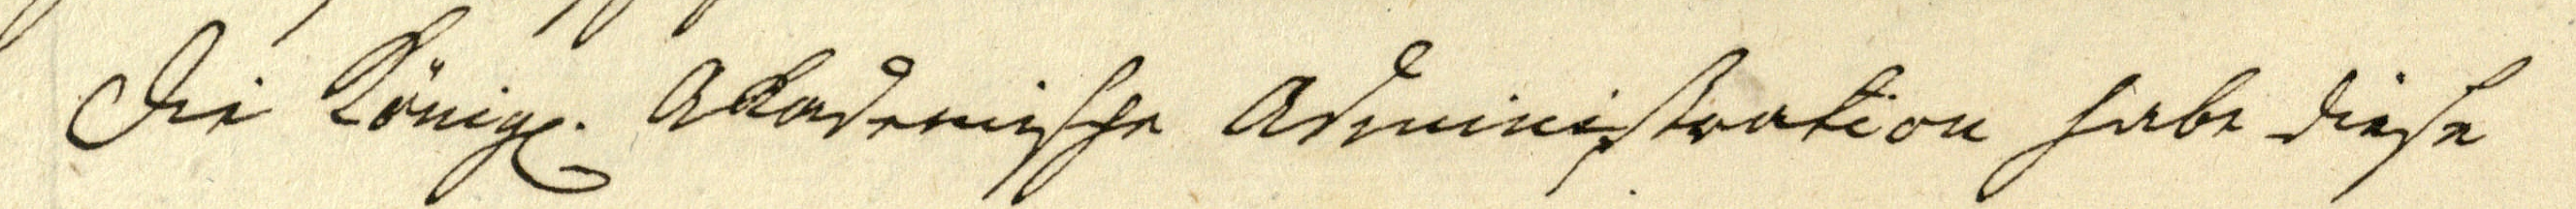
Die Königl. Akademische Administration habe diese
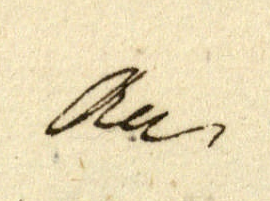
An
